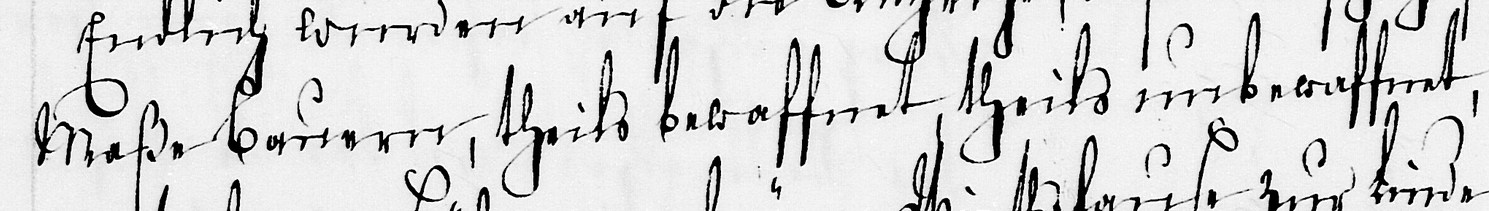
Maße Bauern, theils bewaffnet, theils unbewaffnet,
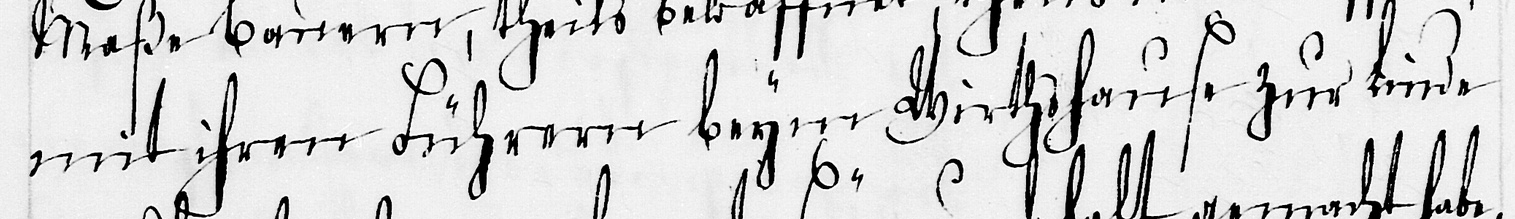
mit ihren Führern beym Wirthshause zur Linde
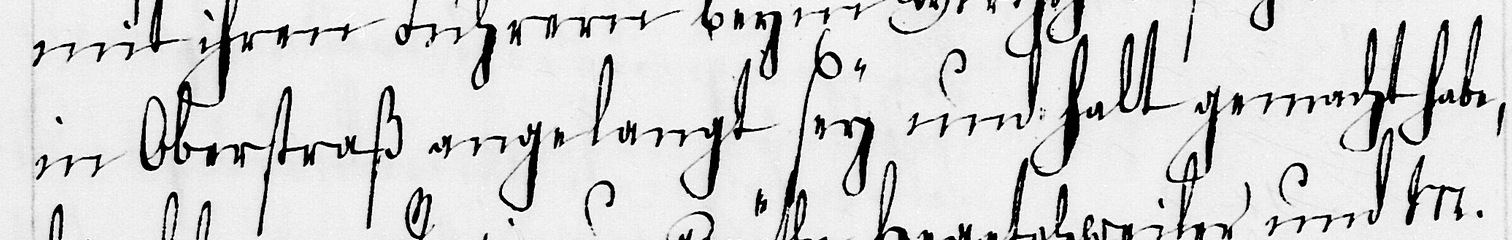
in Oberstraß angelangt sey und halt gemacht ha¬
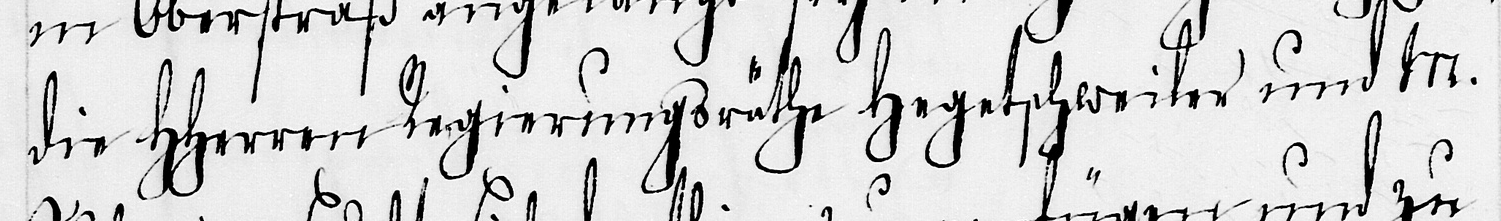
die HHerren Regierungsräthe Hegetschweiler und M.
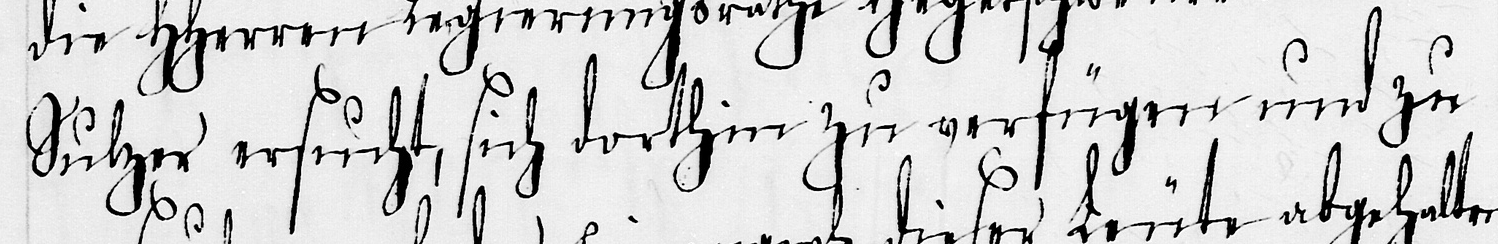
Sulzer ersucht, sich dorthin zu verfügen und zu
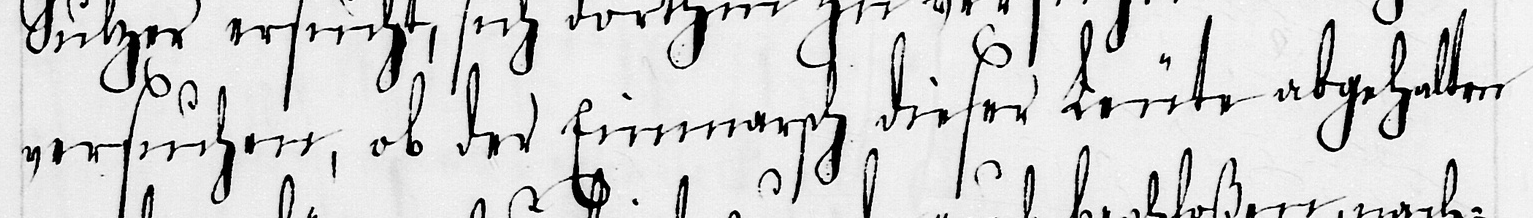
versuchen, ob der Einmarsch dieser Leute abgehalten
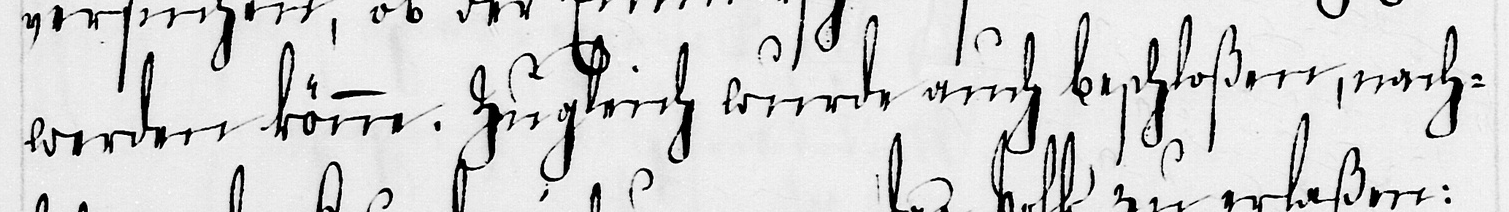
werden könne. Zugleich wurde auch beschloßen, nach¬
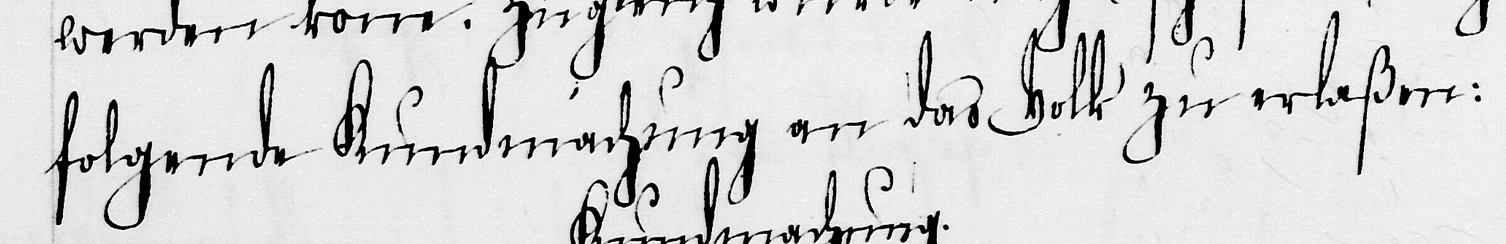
folgende Kundmachung an das Volk zu erlaßen:
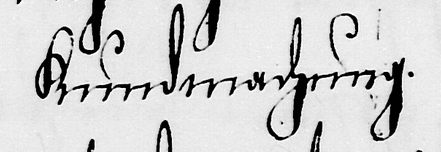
Kundmachung.
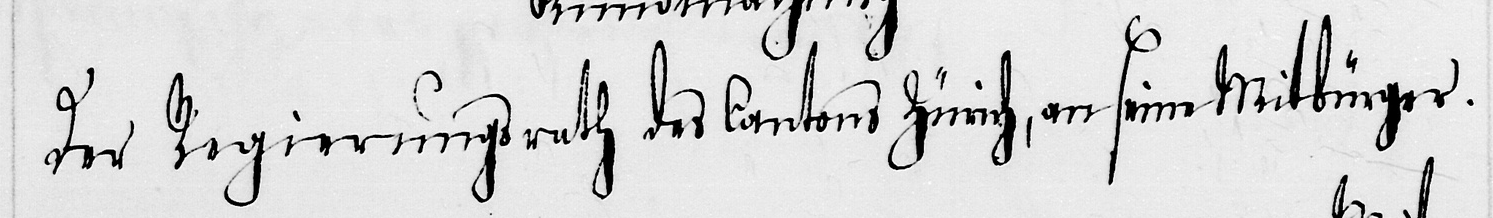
Der Regierungsrath des Cantons Zürich, an seine Mitbürger.
